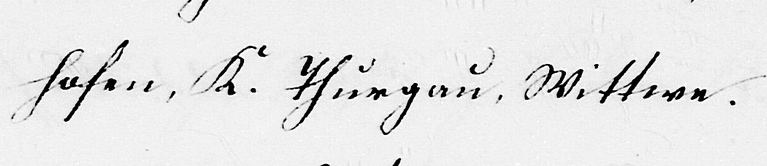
hofen, K. Thurgau. Wittwe.
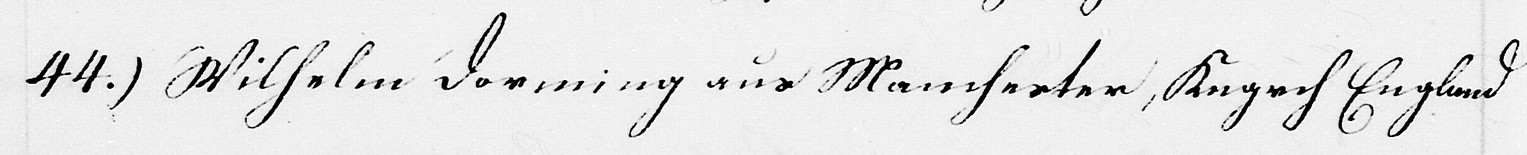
44.) Wilhelm Dorming aus Manchester, Kngrch England
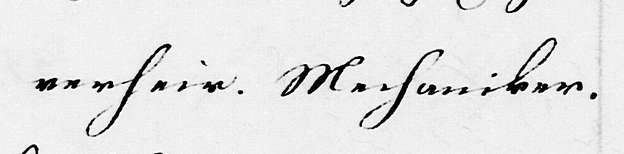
verheir. Mechaniker.
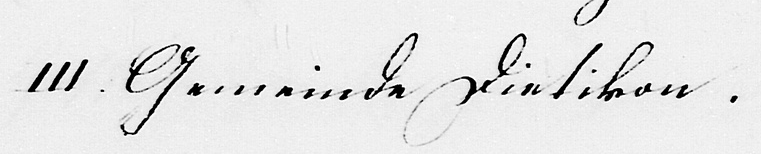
III. Gemeinde Dietikon.
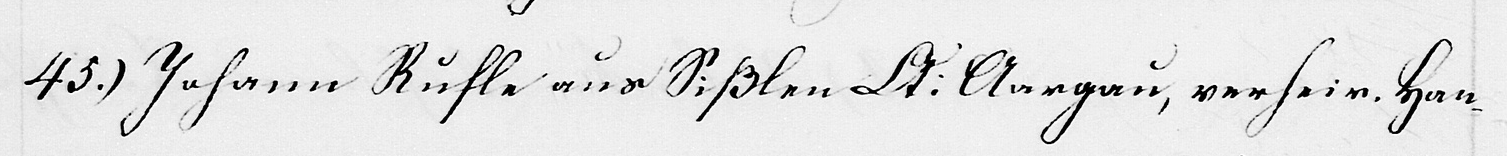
45.) Johann Rufle aus Sißlen Ct: Aargau, verheir. Han¬
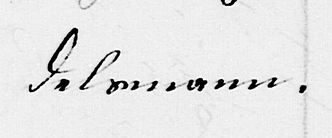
delsmann.
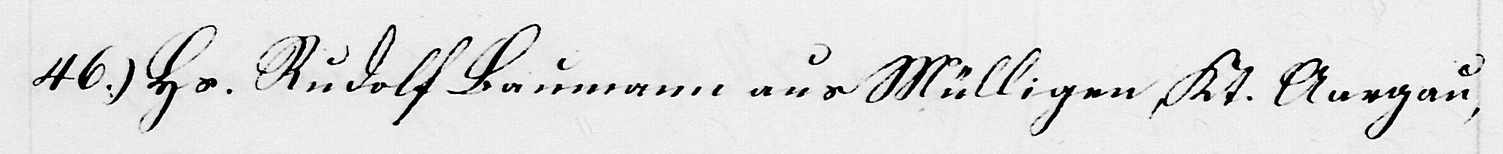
46.) Hs. Rudolf Baumann aus Mülligen, Kt. Aargau,
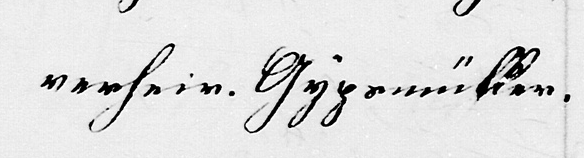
verheir. Gypsmüller.
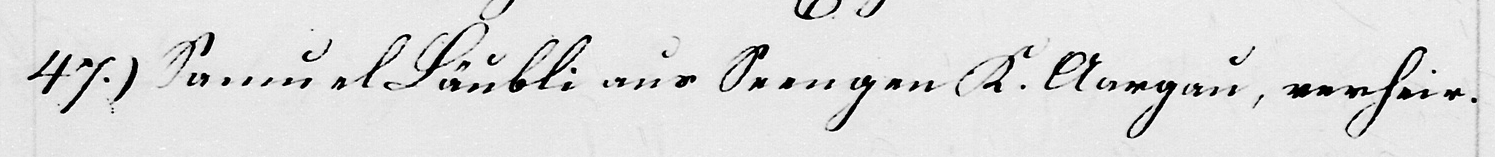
47.) Samuel Läubli aus Seengen K. Aargau, verheir.
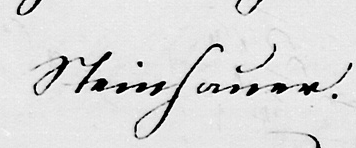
Steinhauer.
